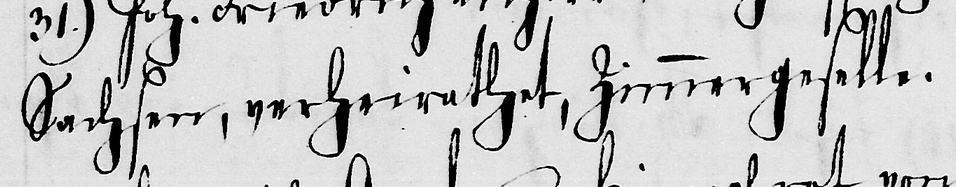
Sachsen, verheirathet, Zimmergeselle.
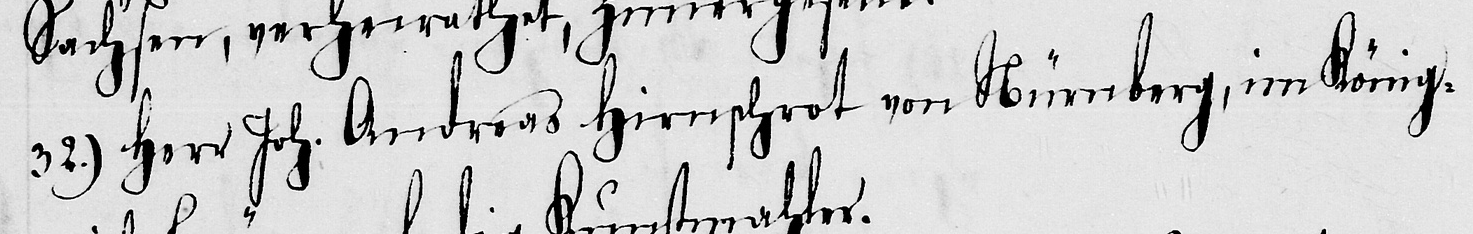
32.) Herr Joh. Andreas Hirnschrot von Nürnberg, im König¬
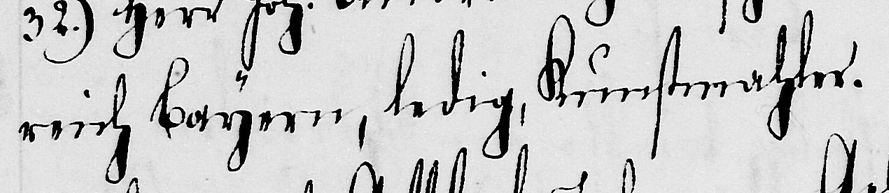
reich Bayern, ledig, Kunstmahler.
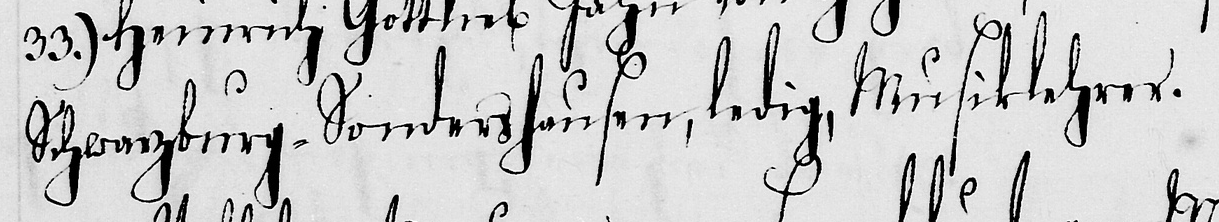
Schwarzburg-Sondershausen, ledig, Musiklehrer.
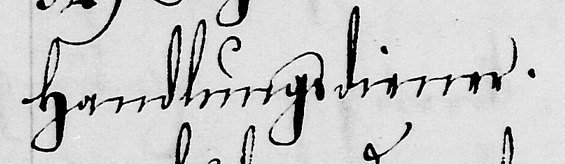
Handlungsdiener.
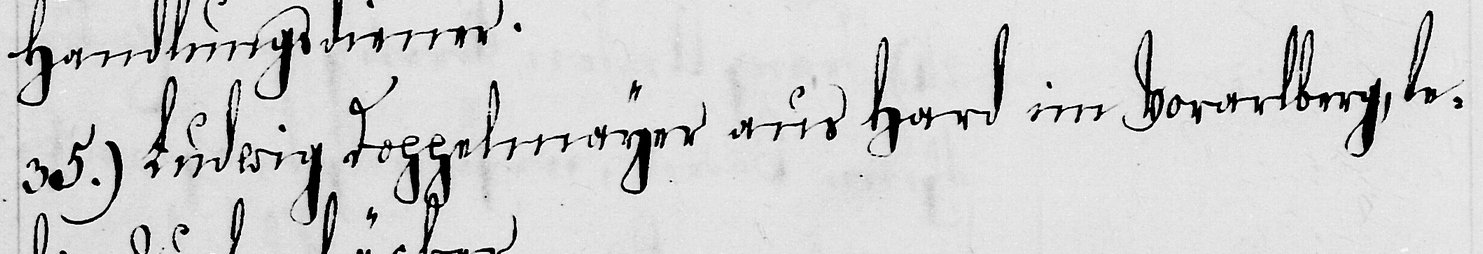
35.) Ludwig Doppelmayer aus Hard im Vorarlberg, le¬
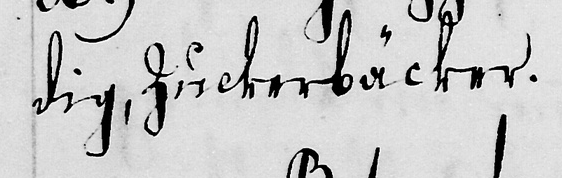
dig, Zuckerbäcker.
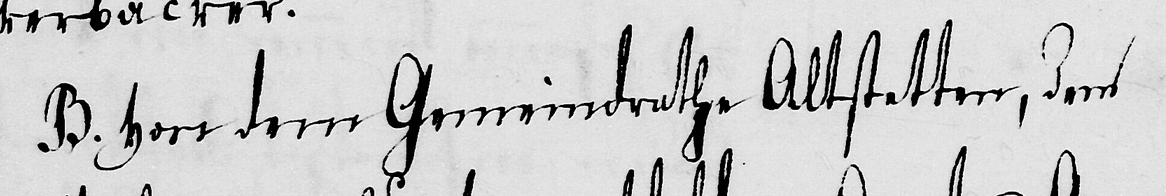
B. Von dem Gemeindrathe Altstetten, dem
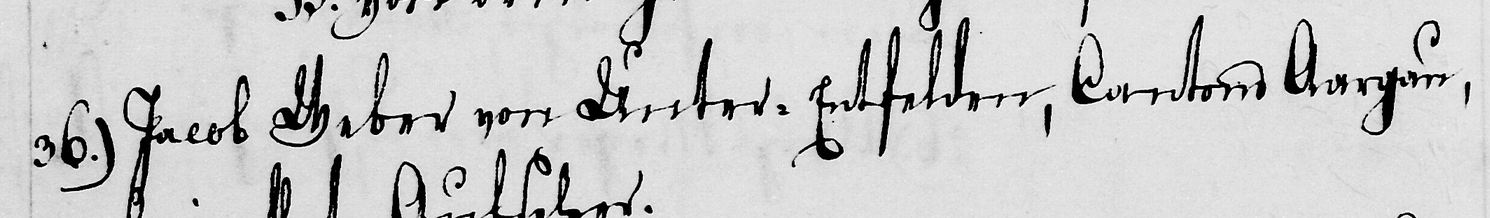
36.) Jacob Weber von Unter-Entfelden, Cantons Aargau,
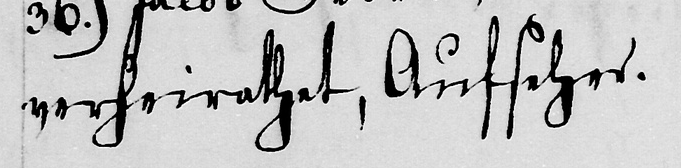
verheirathet, Aufseher.
